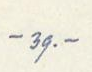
39
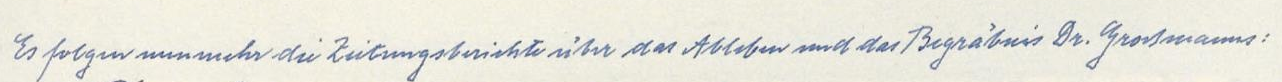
Es folgen nunmehr die Zeitungsberichte über das Ableben und das Begräbnis Dr. Großmanns:
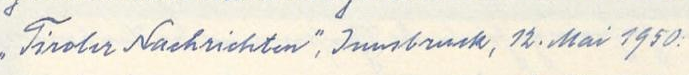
„Tiroler Nachrichten“, Innsbruck, 12. Mai 1950:
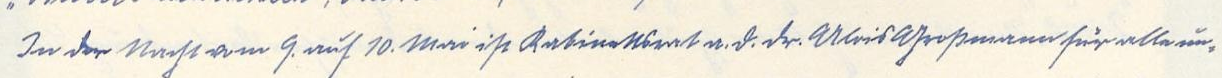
In der Nacht vom 9. auf den 10. Mai ist Kabinettsrat a. D. Dr. Alois Großmann für alle un-
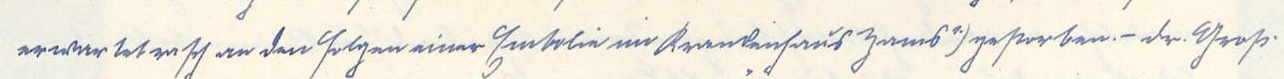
erwartet rasch an den Folgen einer Embolie im Krankenhaus Zams gestorben. - Dr. Groß-
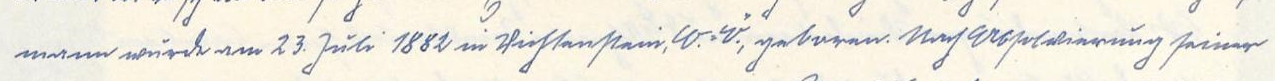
mann wurden 23. Juli 1882 in Vichtenstein, OÖ geboren. Nach Absolvierung seiner
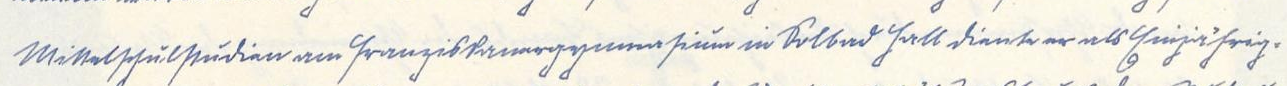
Mittelschulstudien am Franziskanergymnasium in Solbad Hall diente er als Einjährig-
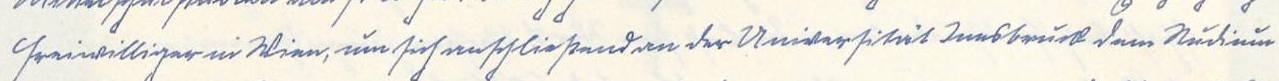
freiwilliger in Wien, um sich anschließend an der Universität Innsbruck dem Studium
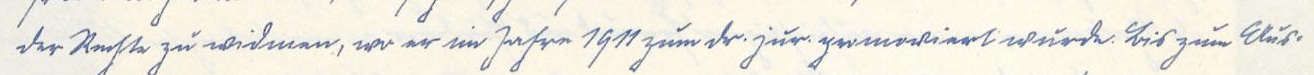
der Rechte zu widmen, wo er im Jahre 1911 zum Dr. iur. promoviert wurde. Bis zum Aus-
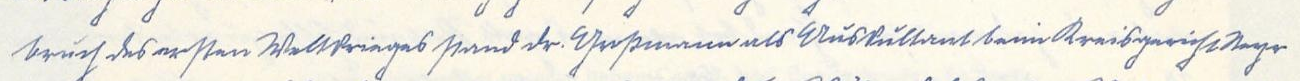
bruch des ersten Weltkrieges stand Dr. Großmann als Auskultant beim Kreisgericht Steyer
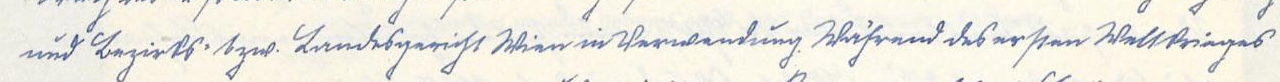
und Bezirks- bzw. Landesgericht Wien in Verwendung. Während des Ersten Weltkrieges
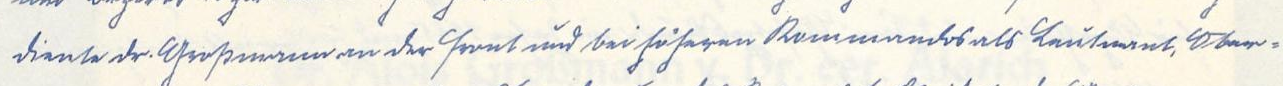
diente Dr. Großmann an der Front und bei höheren Kommandos als Leutnant, Ober-
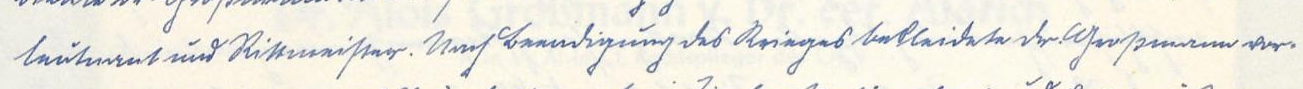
leutnant und Rittmeister. Nach Beendigung des Krieges bekleidete Dr. Großmann vor-
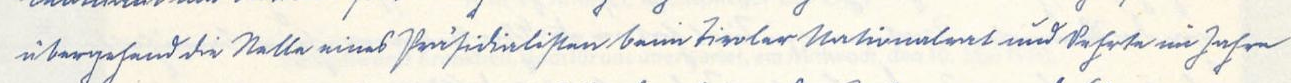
übergehend die Stelle eines Präsidialisten beim Tiroler Nationalrat und kehrte im Jahre
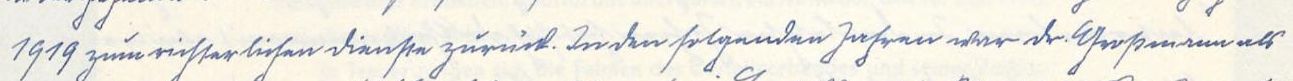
1919 zum richterlichen Dienste zurück. In den folgenden Jahren war Dr. Großmann als
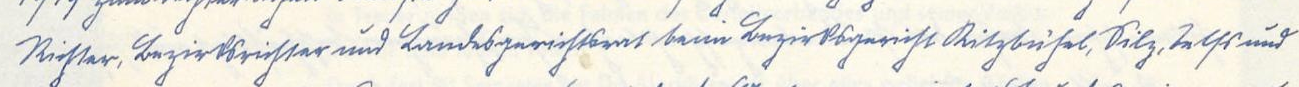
Richter, Bezirksrichter und Landesgerichtsrat beim Bezirksgericht Kitzbühel, Silz, Telfs und
